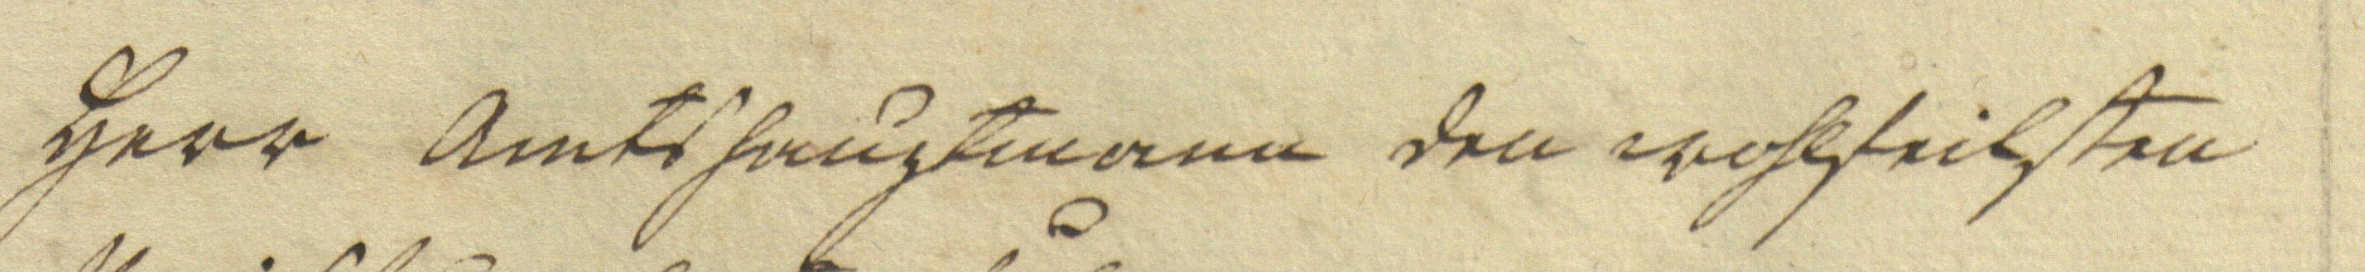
Herr Amtshauptmann den wohlfeilsten
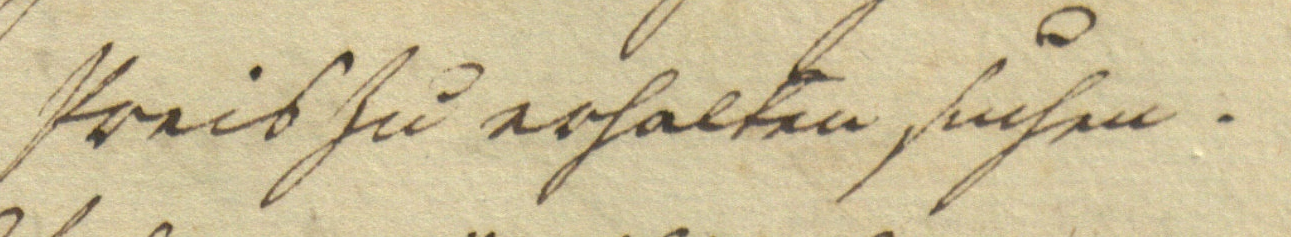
Preis zu erhalten suchen.
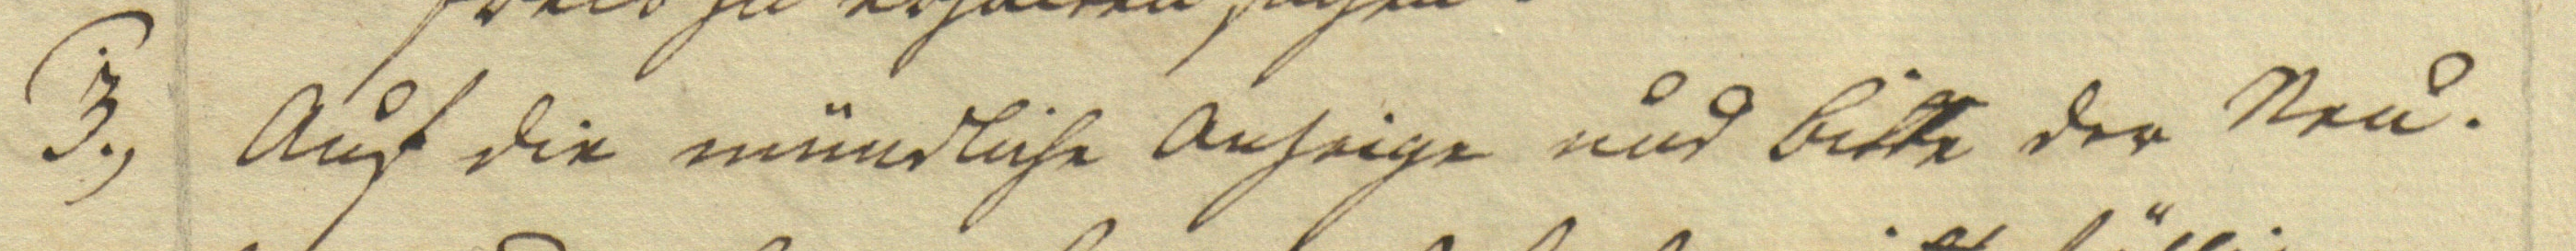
3., Auf die mündliche Anzeige und Bitte der Neu¬
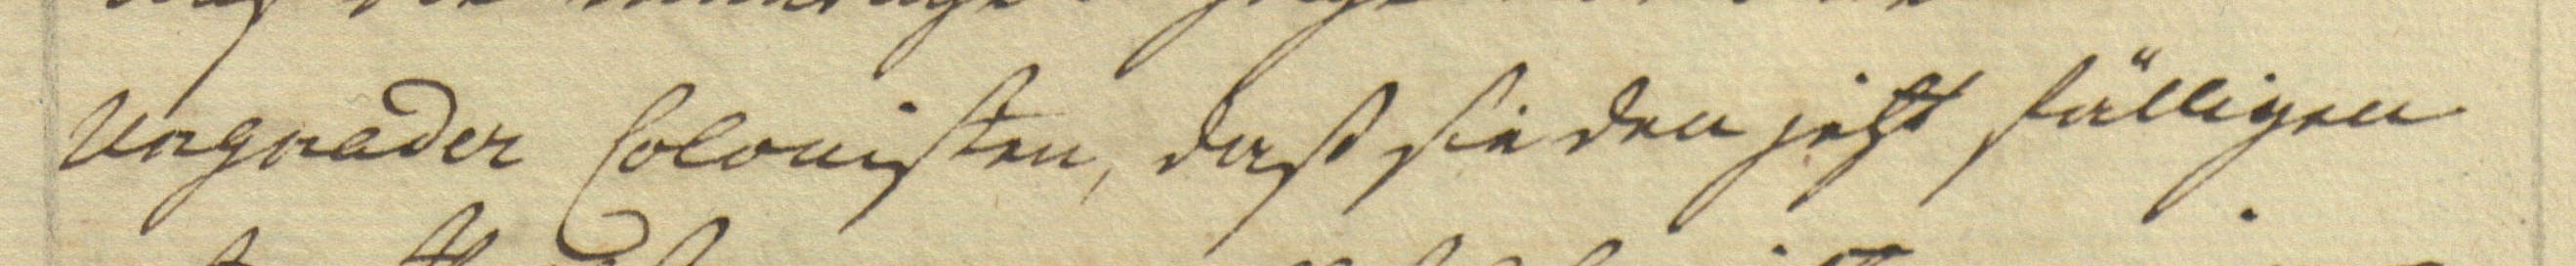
Ungnader Colonisten, daß sie den jetzt fälligen
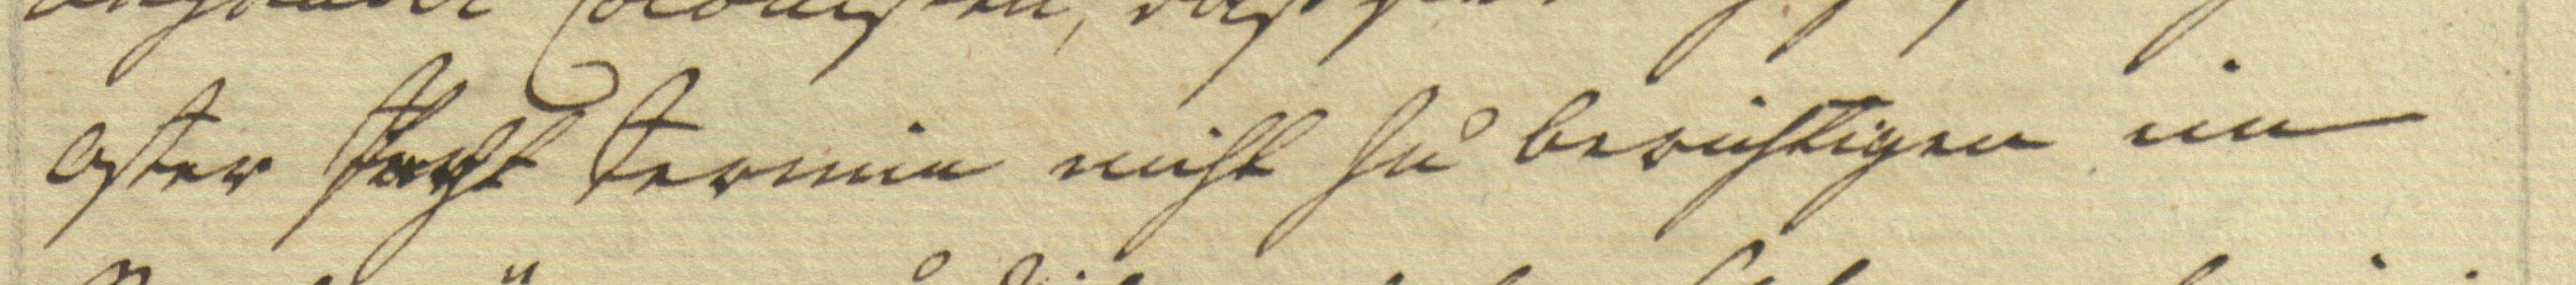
Oster Pacht Termin nicht zu berichtigen im
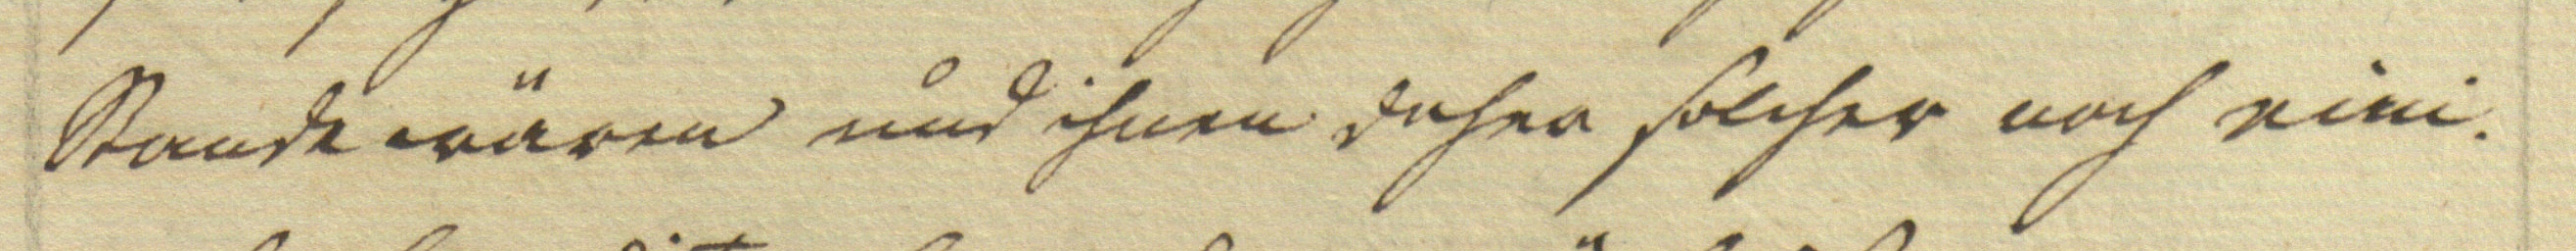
Stande wären und ihnen daher solcher noch eini¬
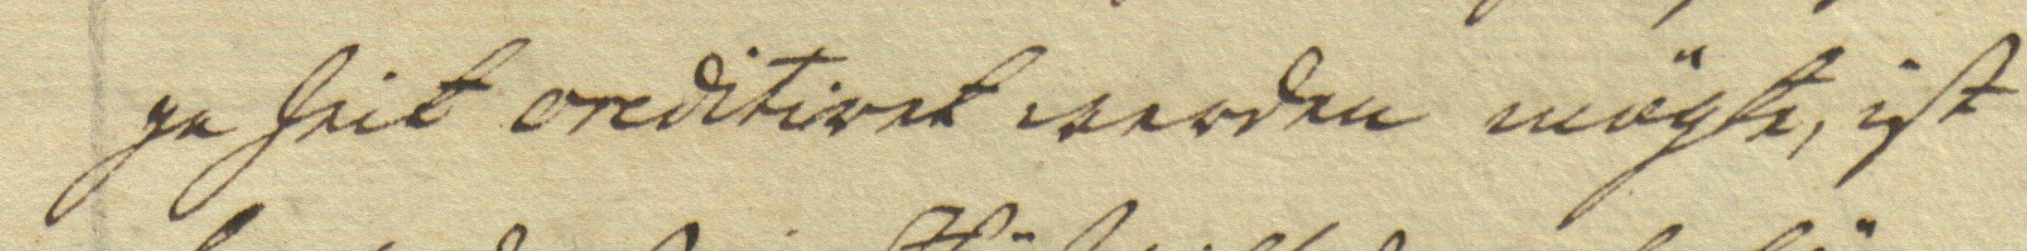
ge Zeit creditiret werden mögte, ist
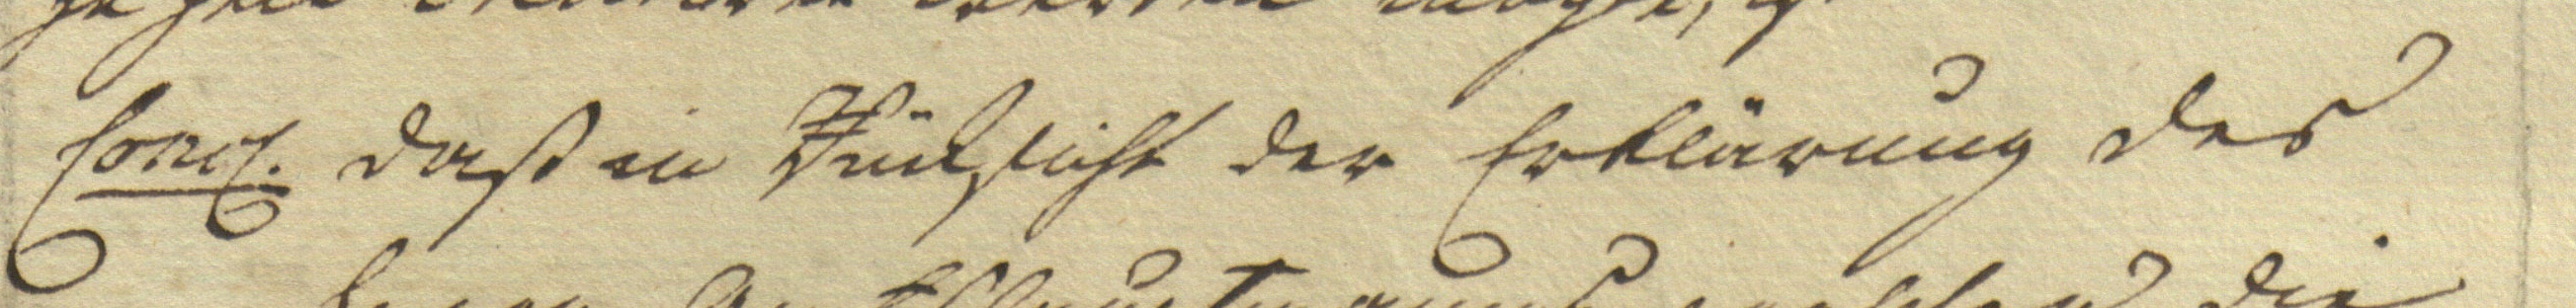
Concl. daß in Rücksicht der Erklärung des
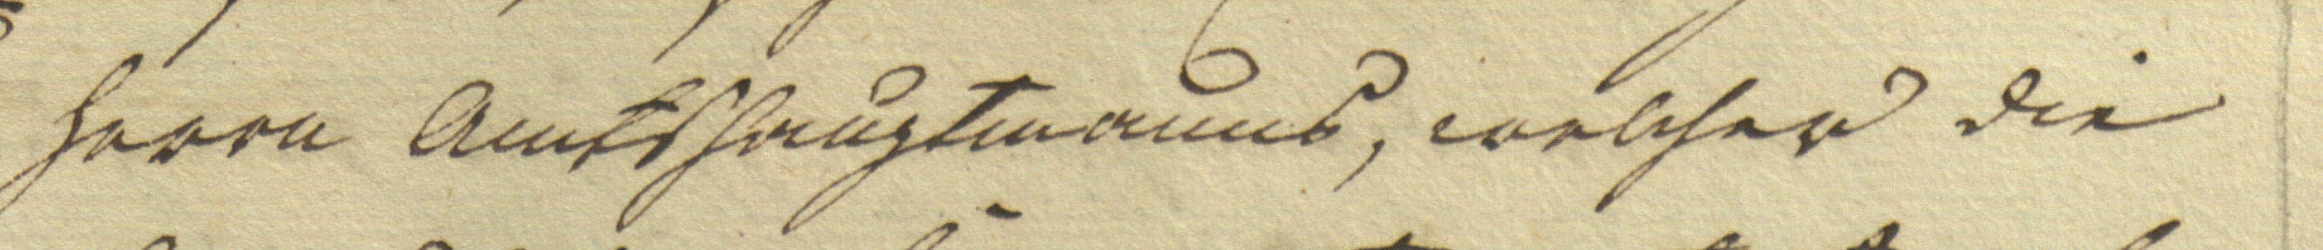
Herrn Amtshauptmanns, welcher die
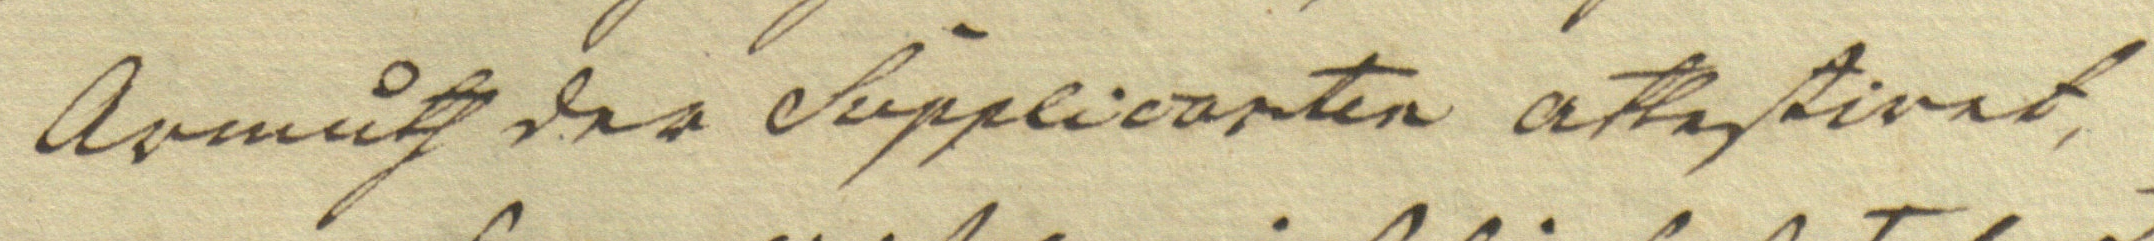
Armuth der Supplicanten attestiret,
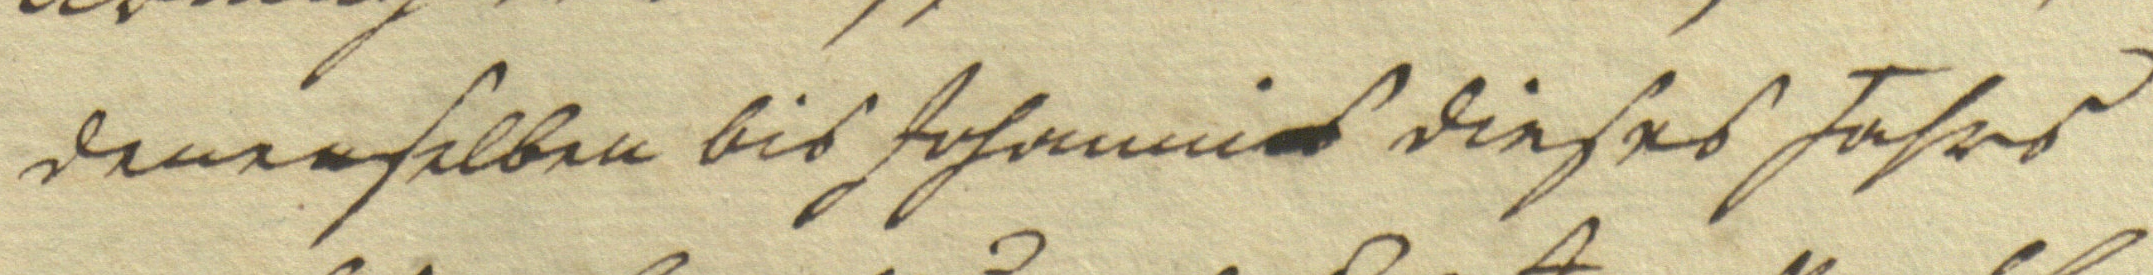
denenselben bis Johannis dieses Jahres
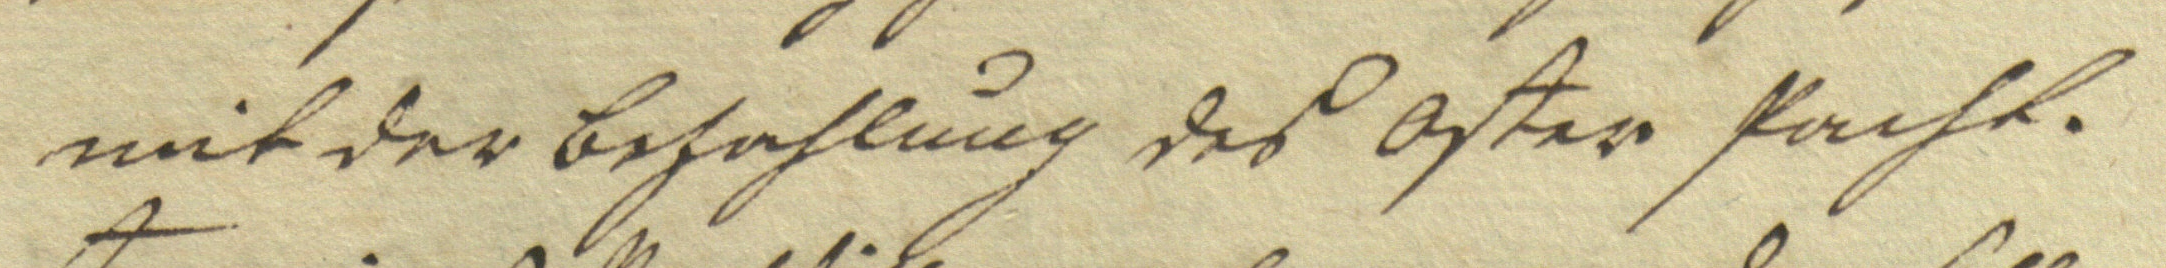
mit der Bezahlung des Oster Pacht¬
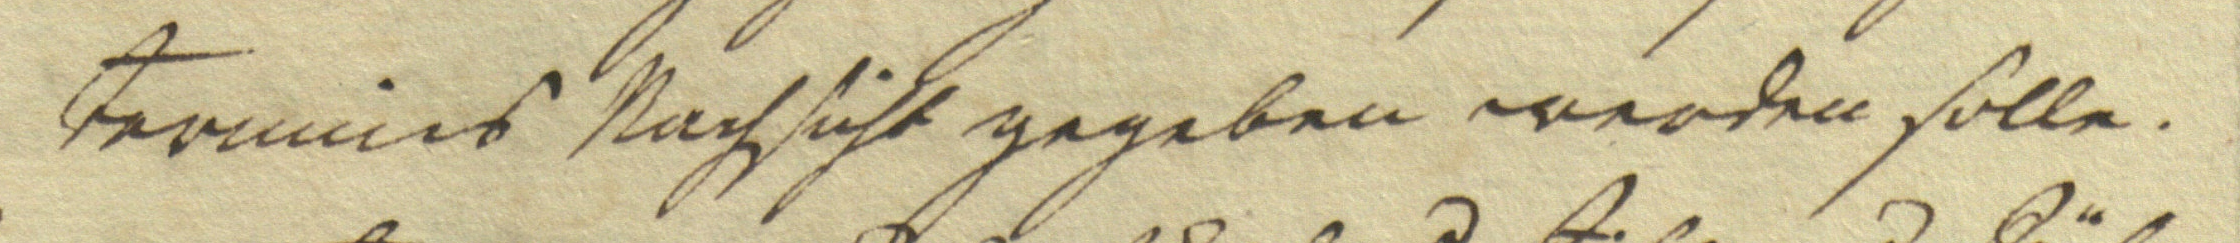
Termins Nachsicht gegeben werden solle.
